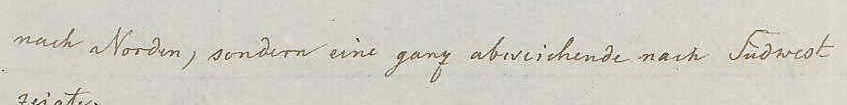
nach Norden, sondern eine ganz abweichende nach Südwest
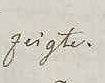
zeigte.
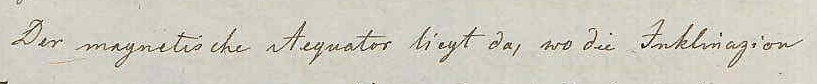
Der magnetische Aequator liegt da, wo die Inklinazion
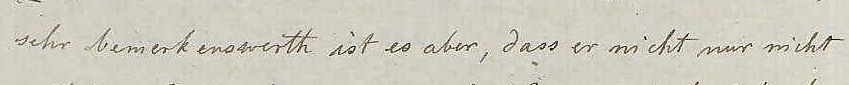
sehr bemerkenswerth ist es aber, dass er nicht nur nicht
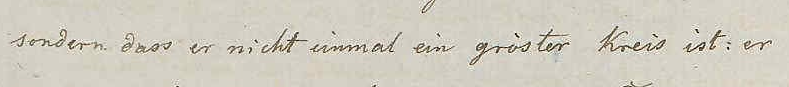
sondern dass er nicht einmal ein gröster Kreis ist: er
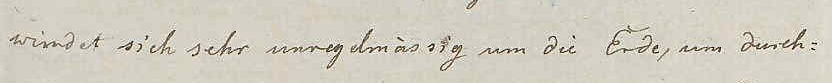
windet sich sehr unregelmässig um die Erde, durch-
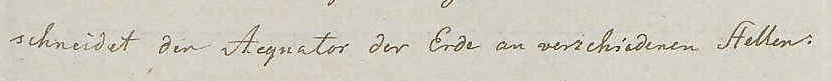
schneidet den Aequator der Erde an verschiedenen Stellen:
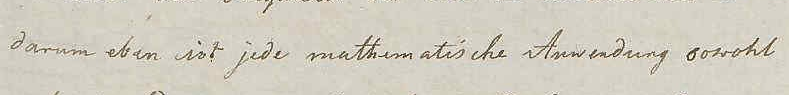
darum eben ist jede mathematische Anwendung sowohl
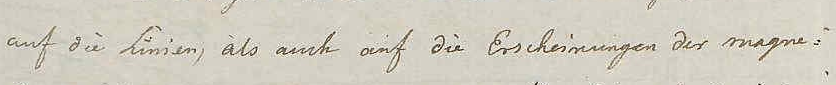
auf die Linien, als auch auf die Erscheinungen der magne-
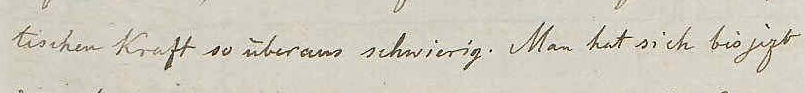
tischen Kraft so überaus schwierig. Man hat sich bis jezt
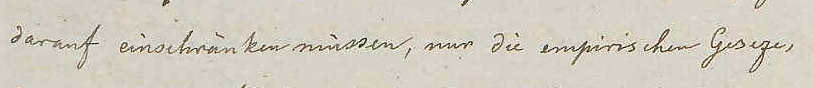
darauf einschränken müssen, nur die empirischen Geseze,
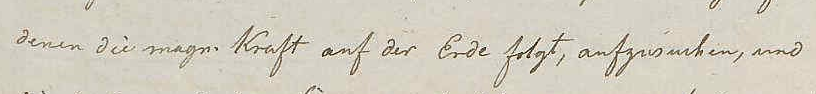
denen die magn. Kraft auf der Erde folgt, aufzusuchen, und
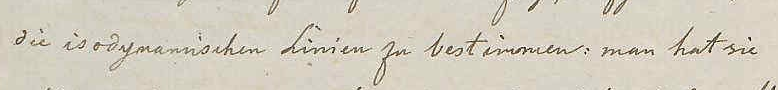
die isodynamischen Linien zu bestimmen: man hat sie
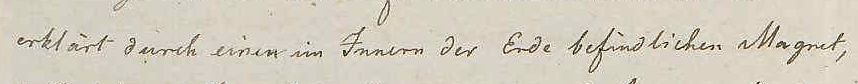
erklärt durch einen im Innern der Erde befindlichen Magnet,
